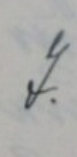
7.
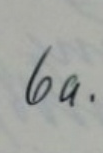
6a
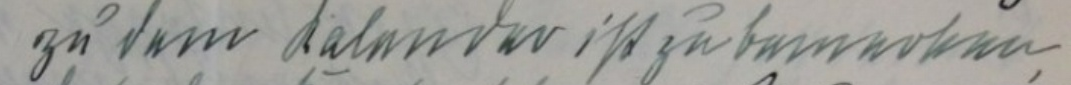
zu dem Kalender ist zu bemerken
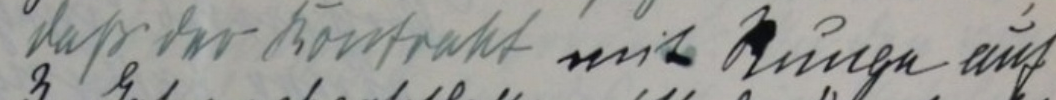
daß der Kontrakt mit Runge auf
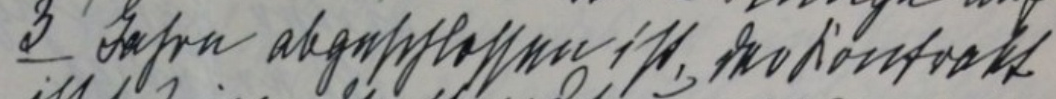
3 Jahre abschlossen ist. Der Kontrakt
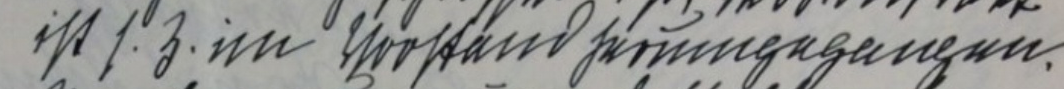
ist s. Z. im Vorstand herumgeganen.
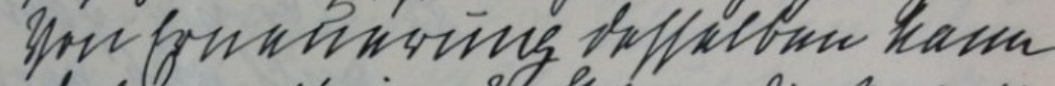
Von Erneuerung desselben kann
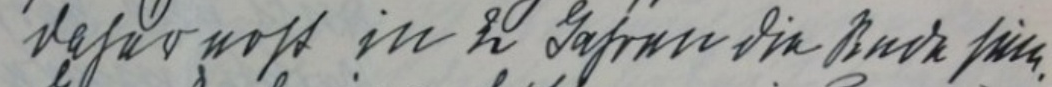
daher noch in 2 Jahren die Rede sein.
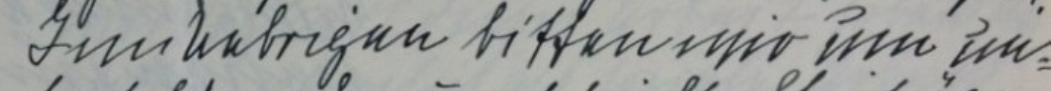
Im Uebrigen betten mir um un
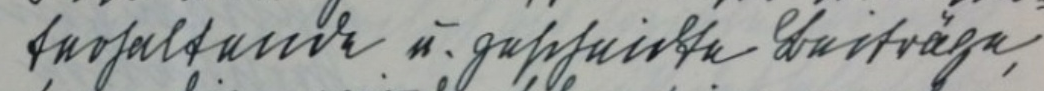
ferhaltende u. gescheite Beiträge
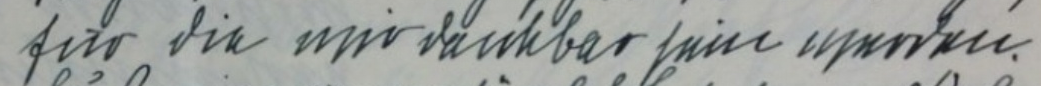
für die mir dankbar sein werden.
